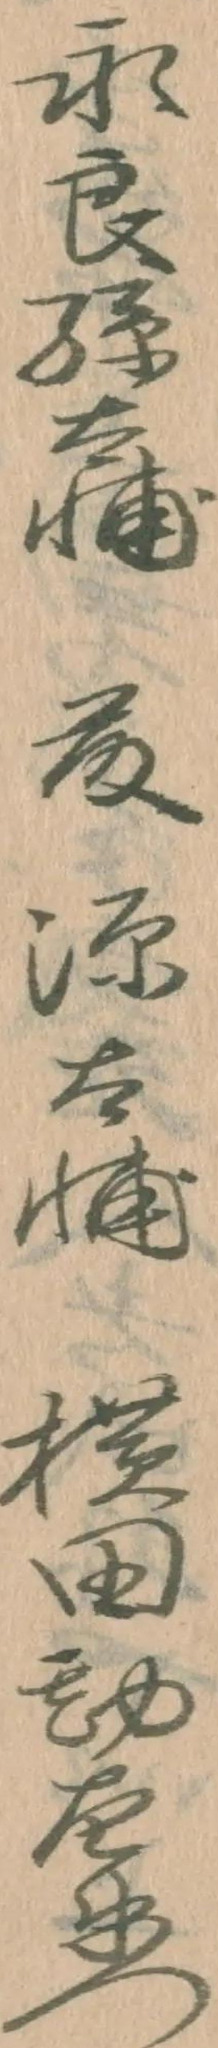永良孫太輔藤源太輔横田干左衛門
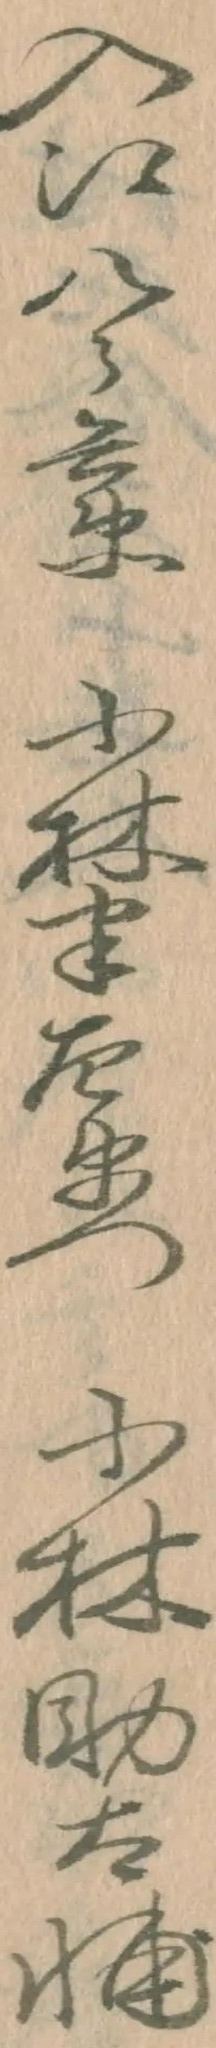入江八郎兵衛小林半左衛門小林助太輔
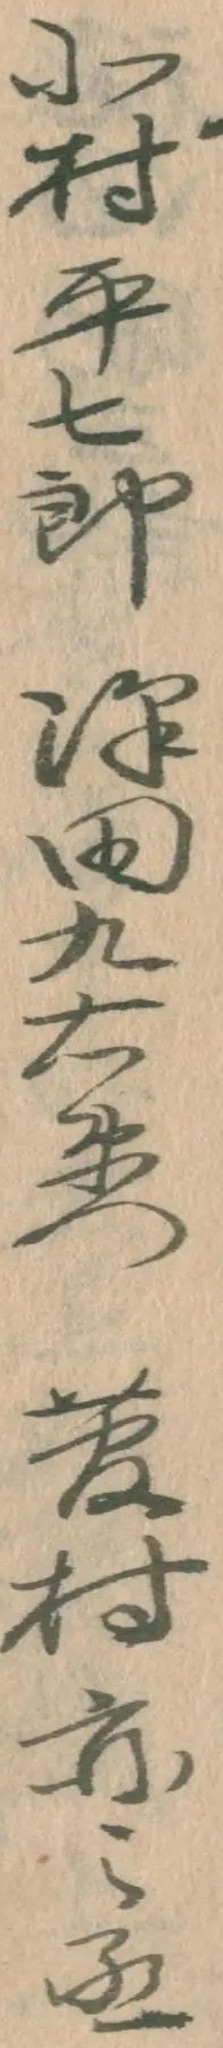北村平七郎沢田九右衛門菅村亦之丞
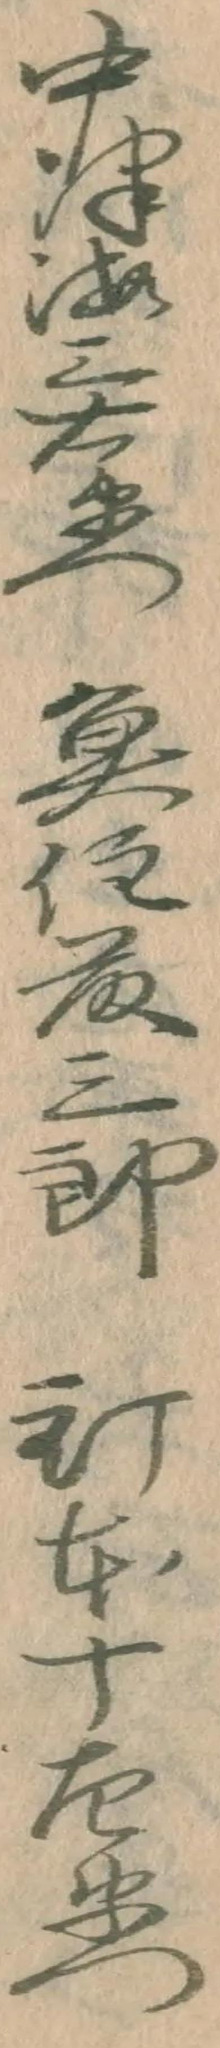中津海三右衛門魚住藤三郎釘本十左衛門
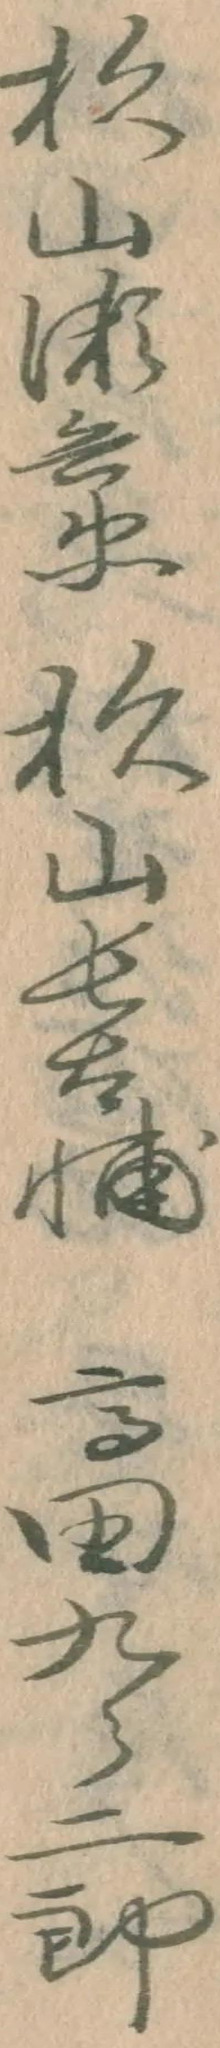杉山瀬兵衛杉山長太輔高田九郎二郎
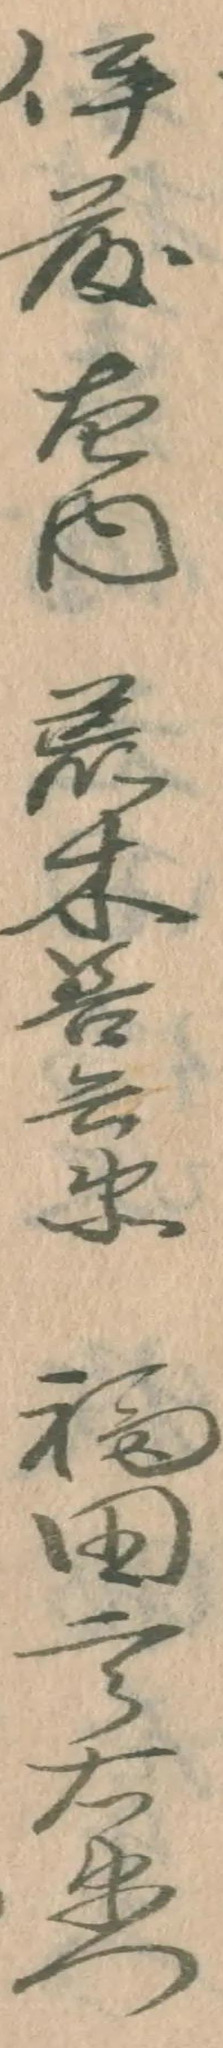伊藤左内荒木善太輔福田二郎右衛門
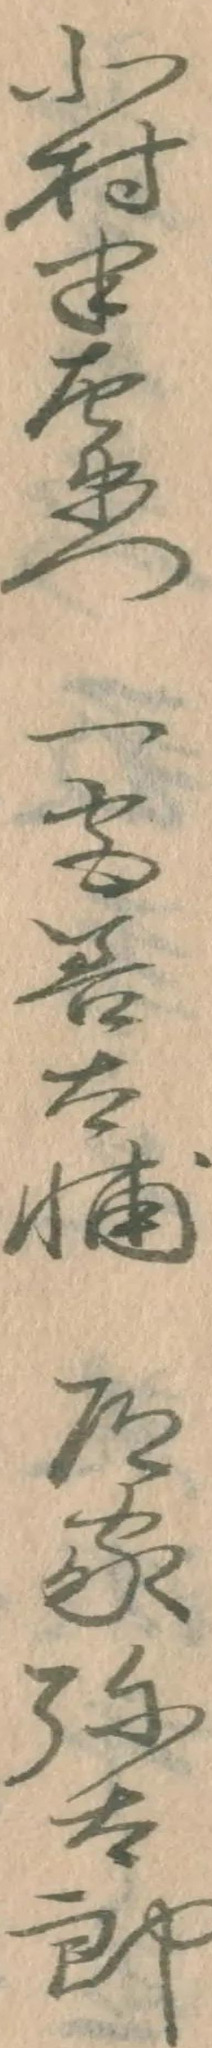北村半左衛門一宮善太輔道家弥太郎
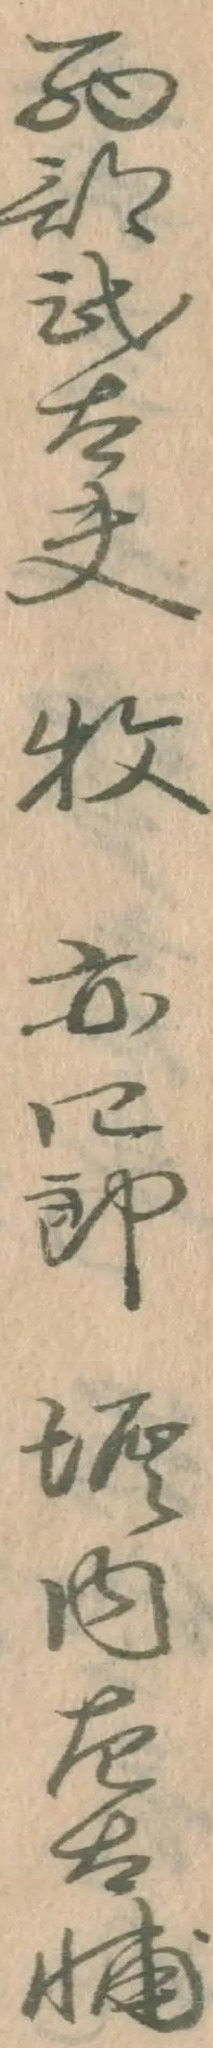西部武太夫牧亦四郎堀内左太輔
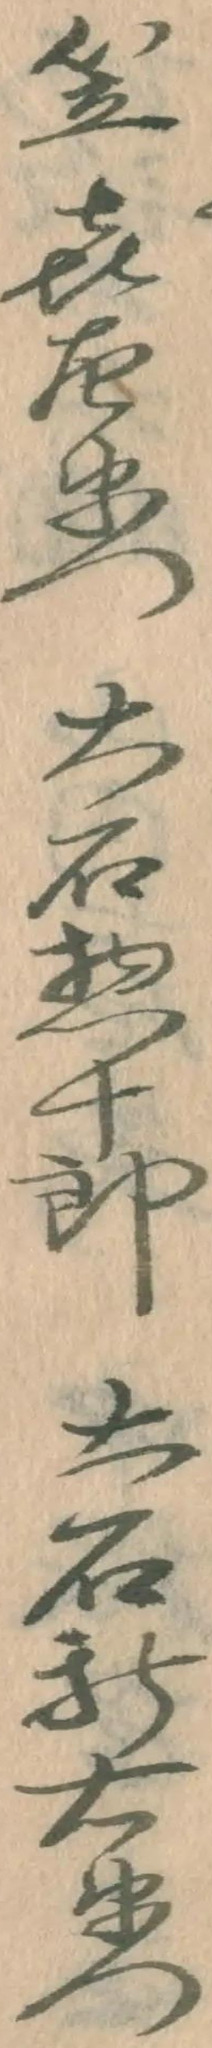笠喜左衛門大石惣十郎大石新右衛門

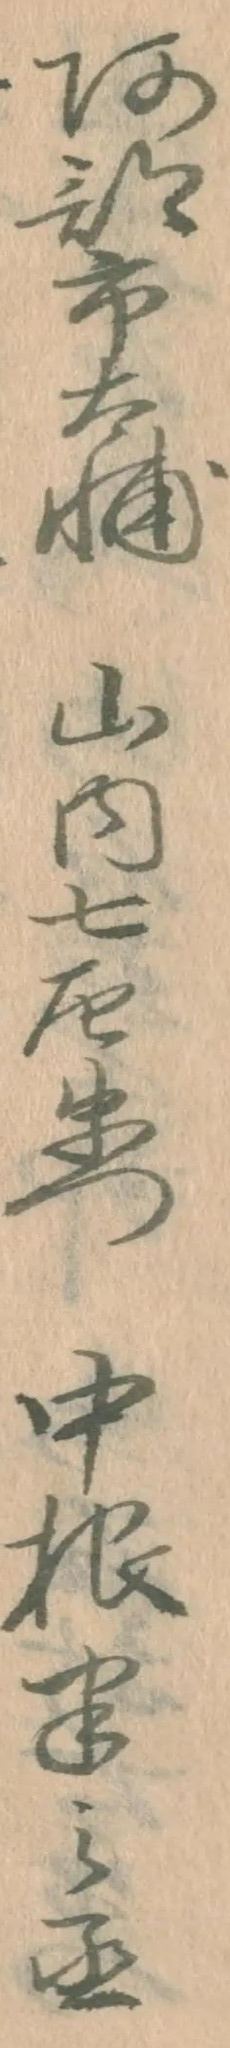阿部市太輔山内七左衛門仲根半之丞
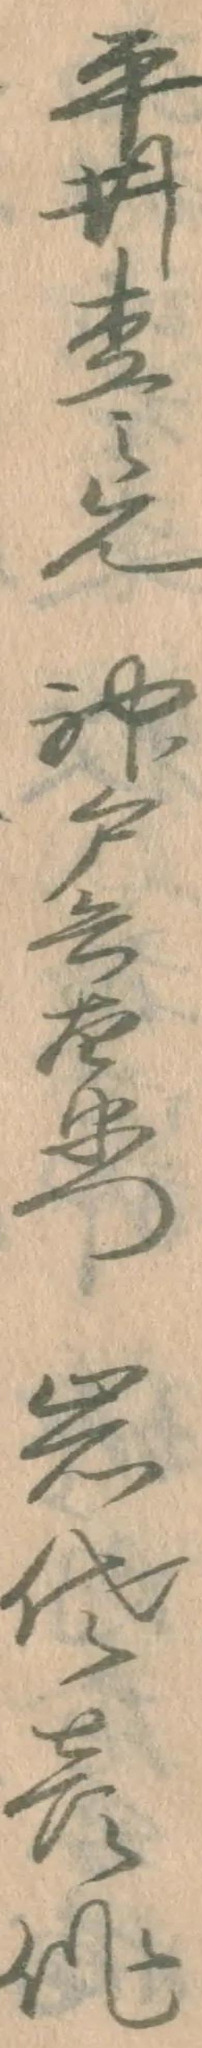平井杢之允神戸兵左衛門岩佐彦作
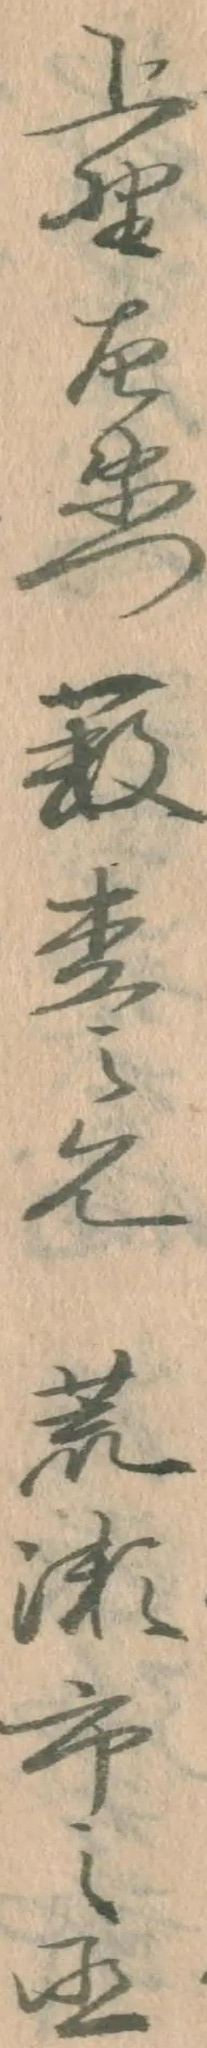上野左衛門藪杢之允荒瀬市之丞
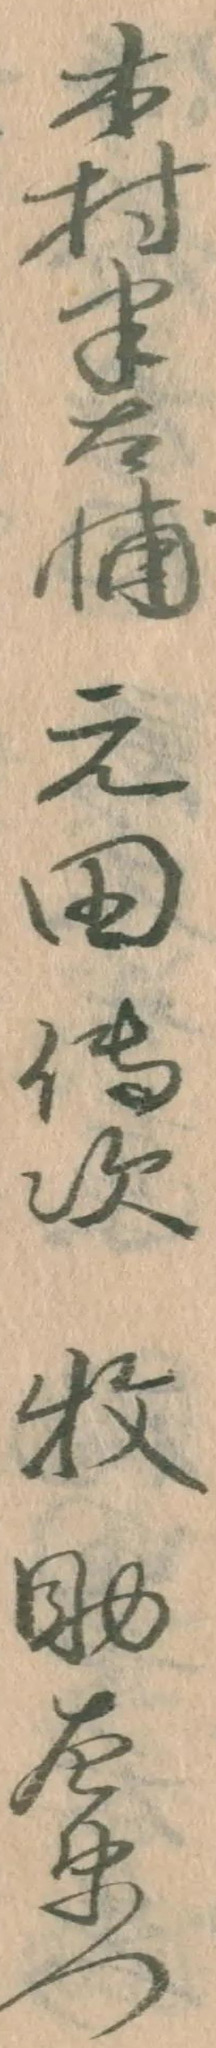木村半太輔元田伝次牧助左衛門
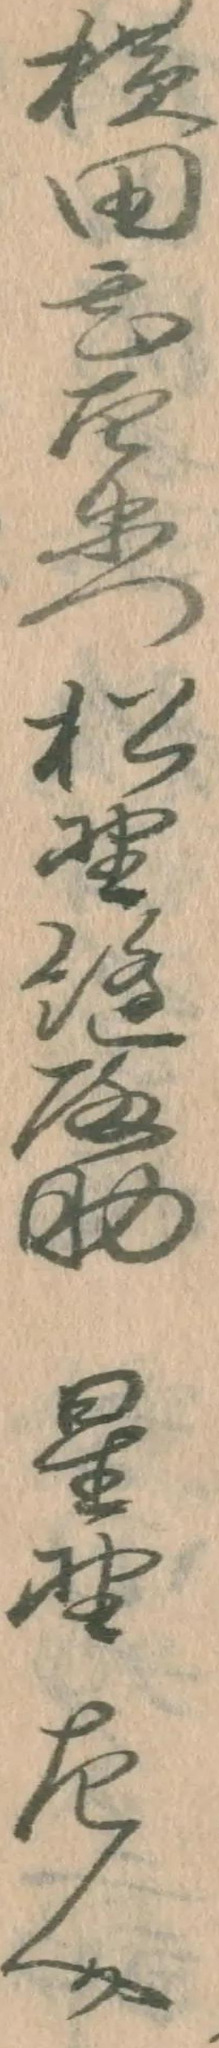横田甚左衛門松野縫殿助星野左介
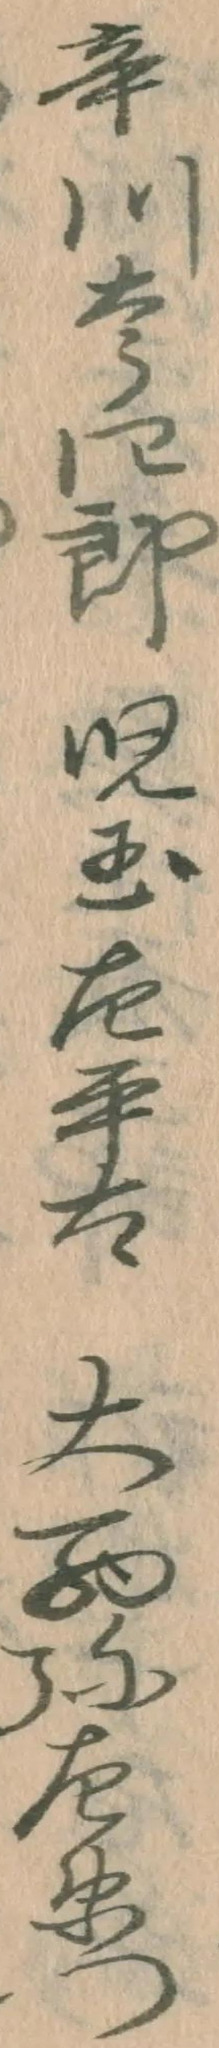辛川太郎四郎児玉左平太大西弥左衛門
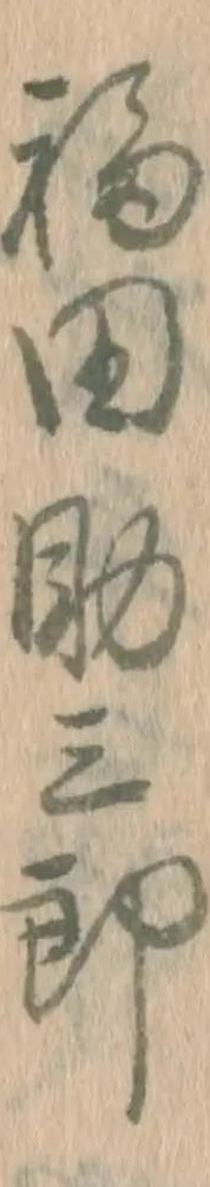福田助三郎
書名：切支丹御退治記 49巻. [9]
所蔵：国立国会図書館 National Diet Library, JAPAN
